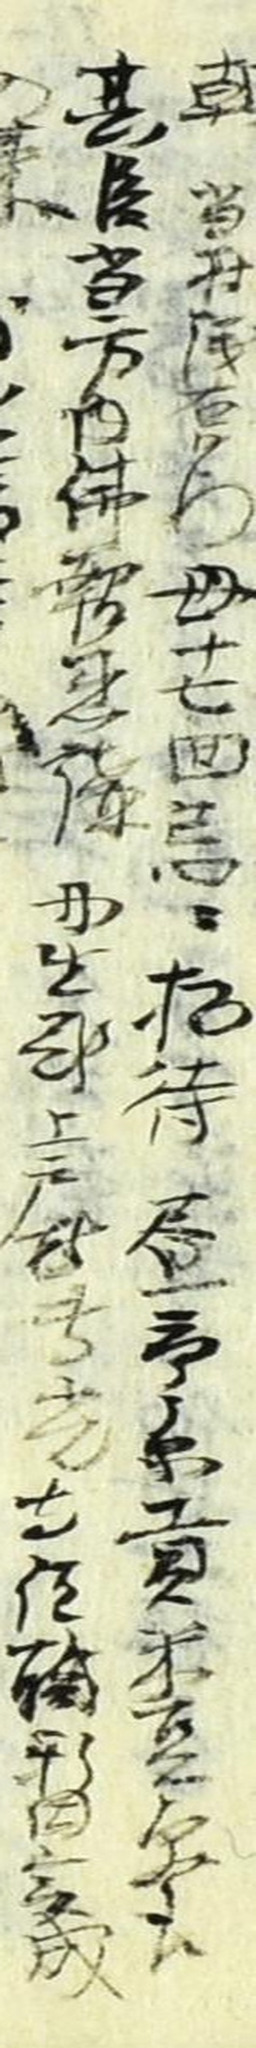其後当方内仏報恩講丹生郡上戸村専光寺住職新田実成
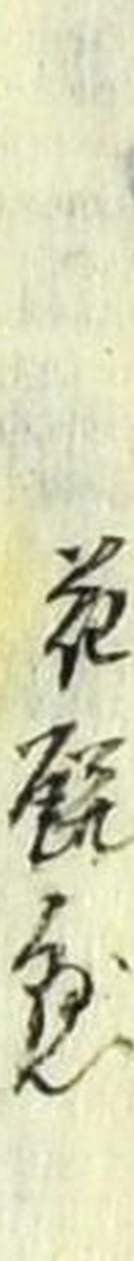花瓶懸
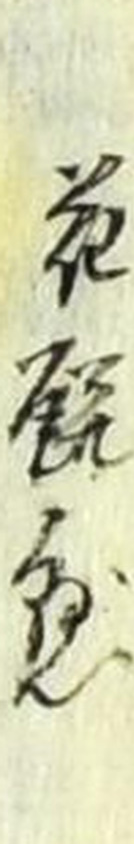花瓶懸
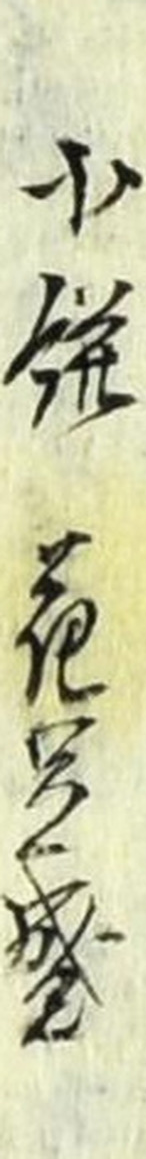小餅花足盛
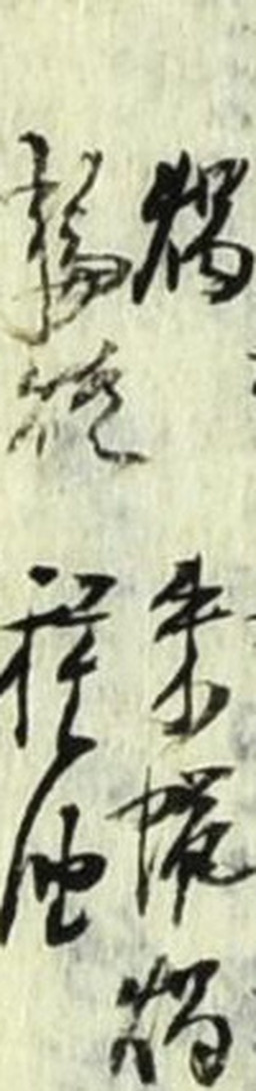輪灯種油
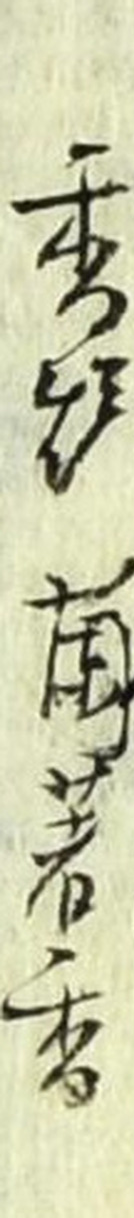香炉蘭著香
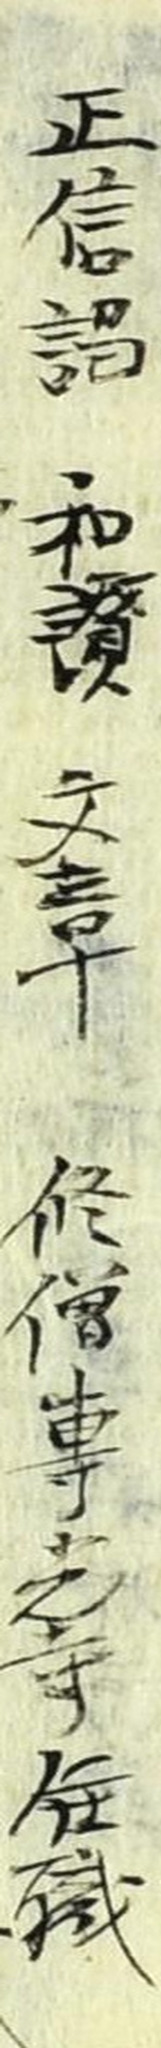正信謁和讃文章修僧専光寺住職
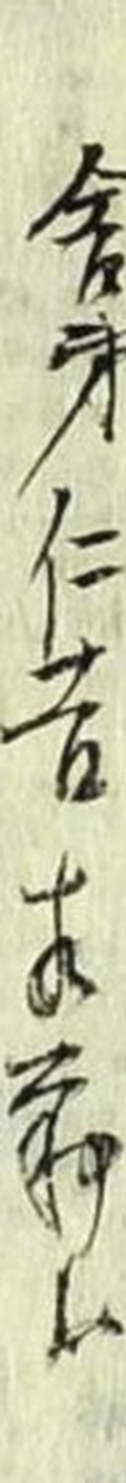舎弟仁吉相勤候
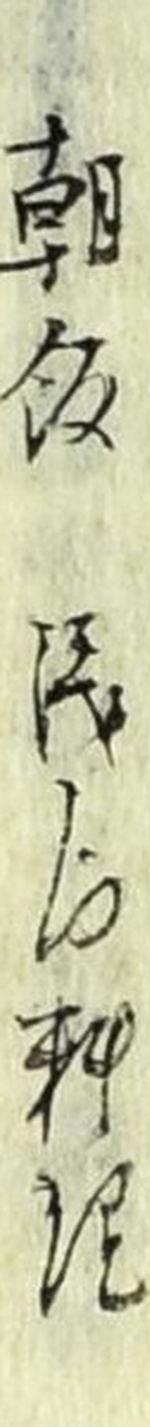朝飯浅右衛門料理
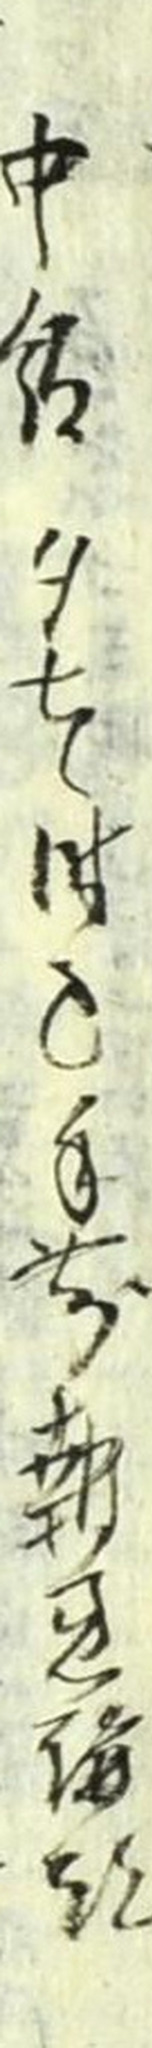中飯夕七ツ時迄手前報恩講跡

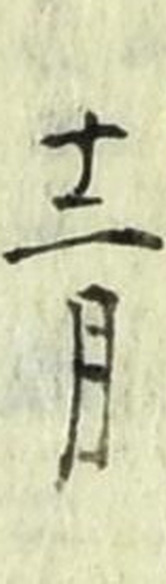十二月
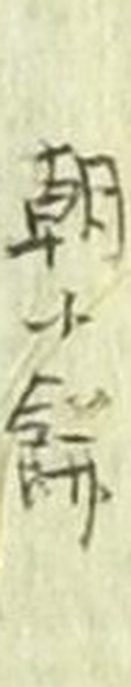朝小餅
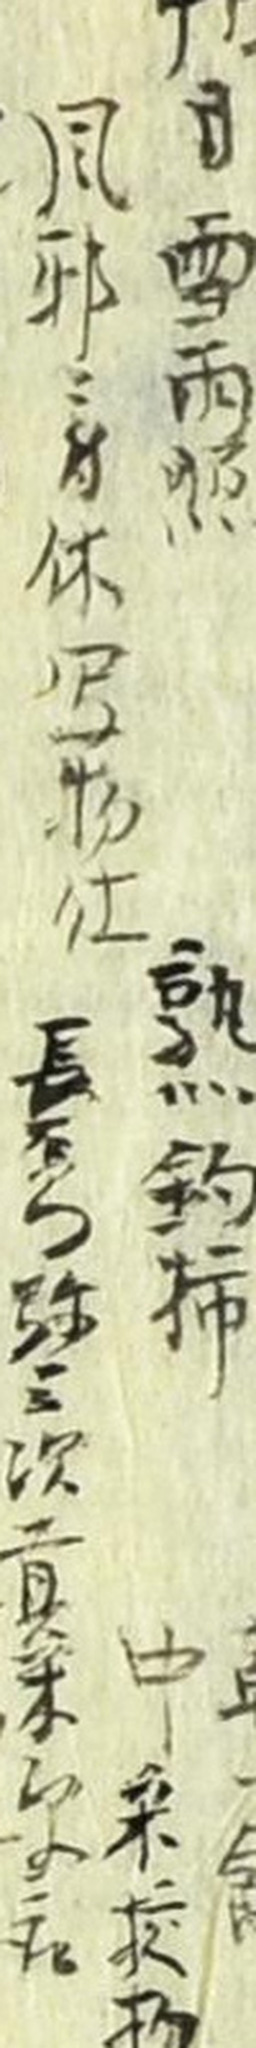風邪ニ付休写物仕長左衛門弥三次貢米受取
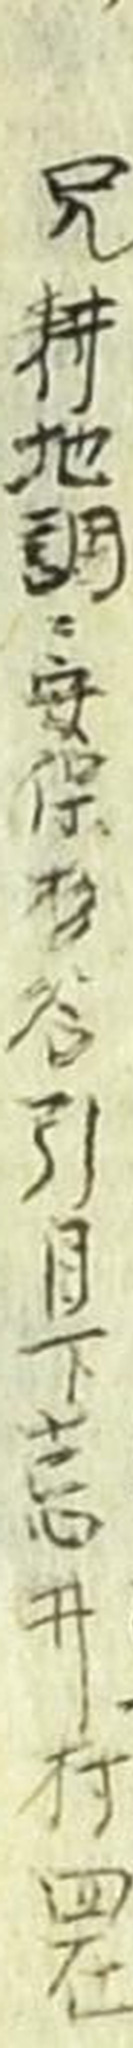兄耕地調ニ安保栃谷引目下荒井村回在
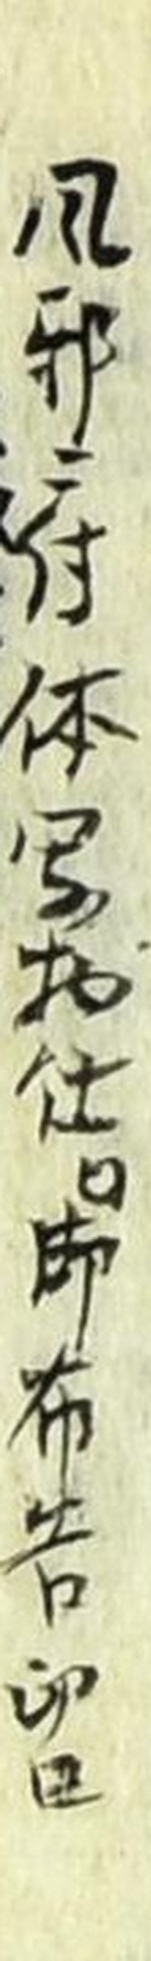風邪ニ付体写物仕○御布告留
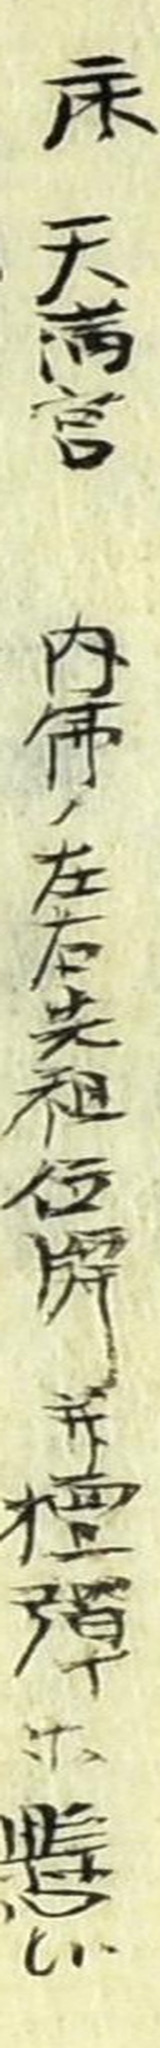床天満宮内仏ノ左右先祖位牌幷檀彈等懸候
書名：（日記）
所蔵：福井県文書館 Fukui Prefectural Archives
